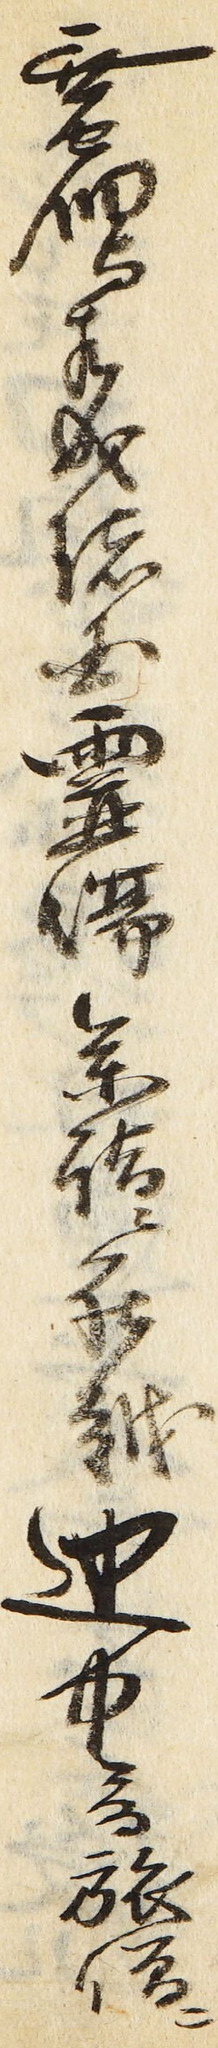無宿と相成諸国霊場参詣に罷越迚中に而旅僧に
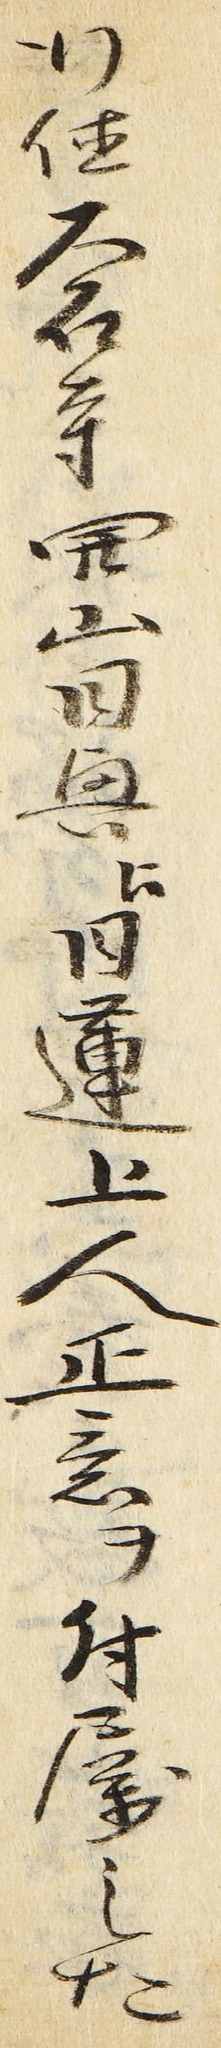行値大石寺開山日興江日蓮上人正意を付属した

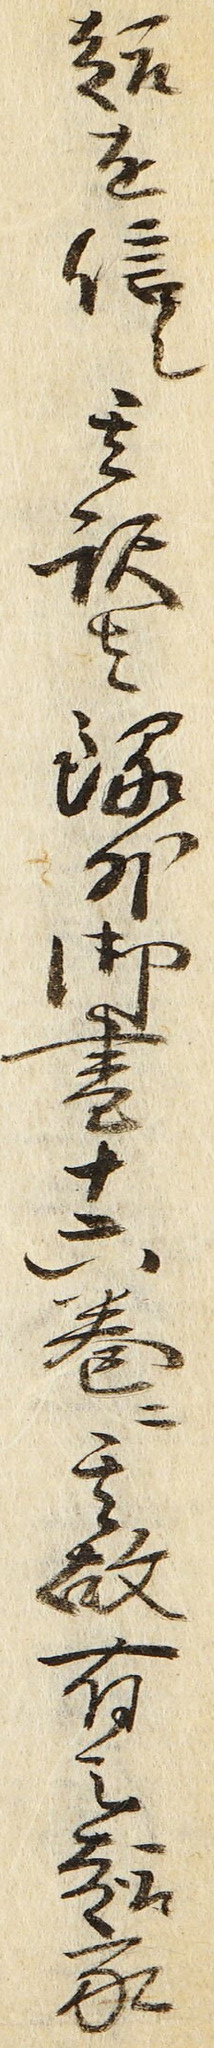趣を信し其訳は録外御書十六巻に其故有之趣承
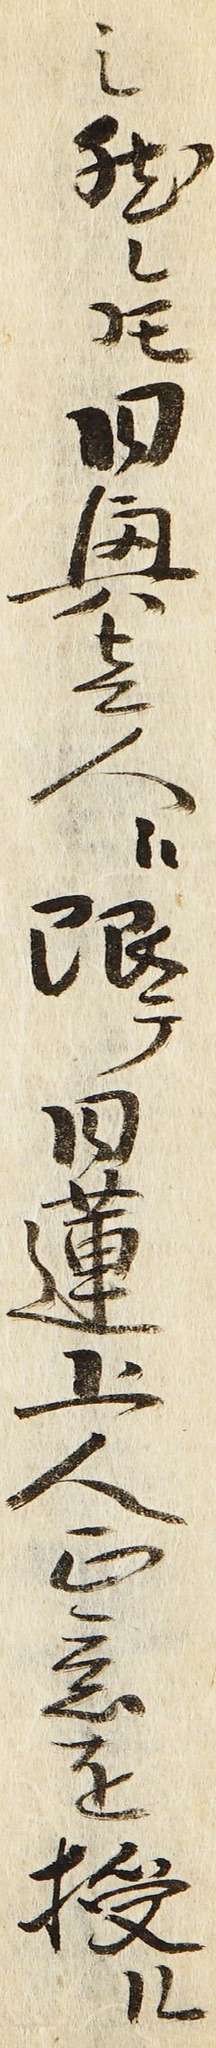之然レトモ日興壱人江限テ日蓮上人正意を授ル
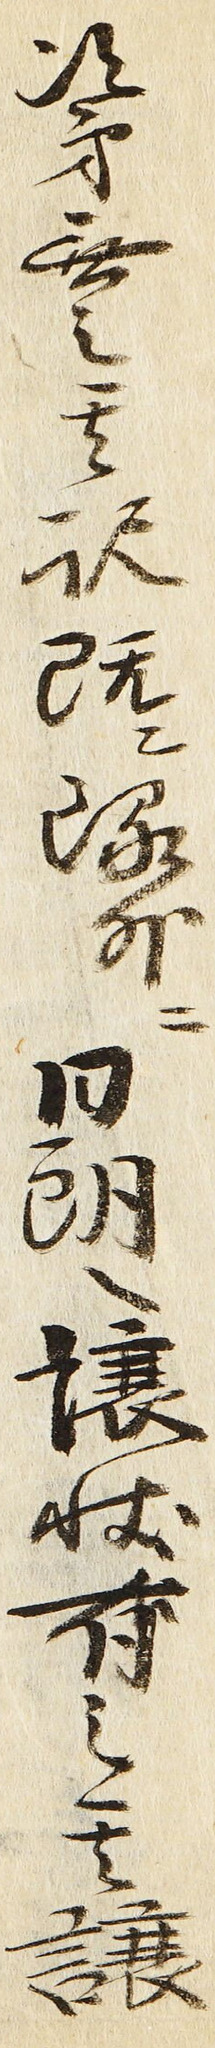次第無之其訳既に録外に日朗へ譲状有之其譲
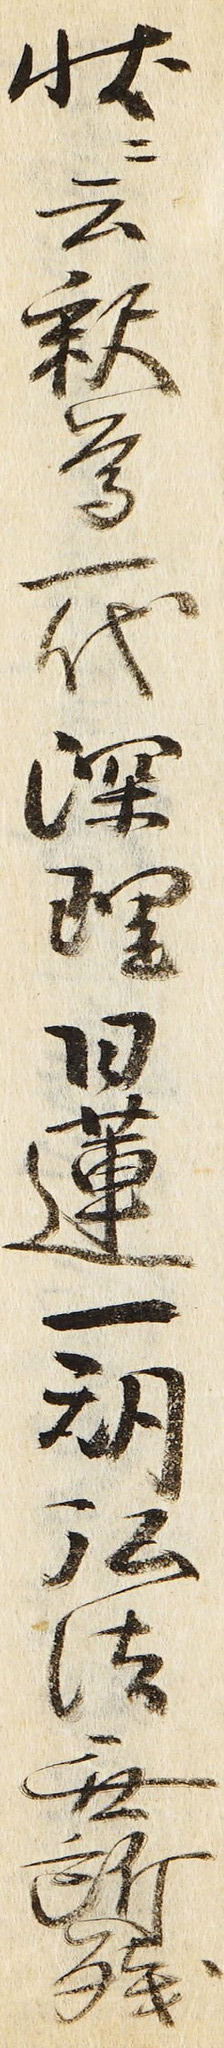状に云釈尊一代深理日蓮一期弘法無所残
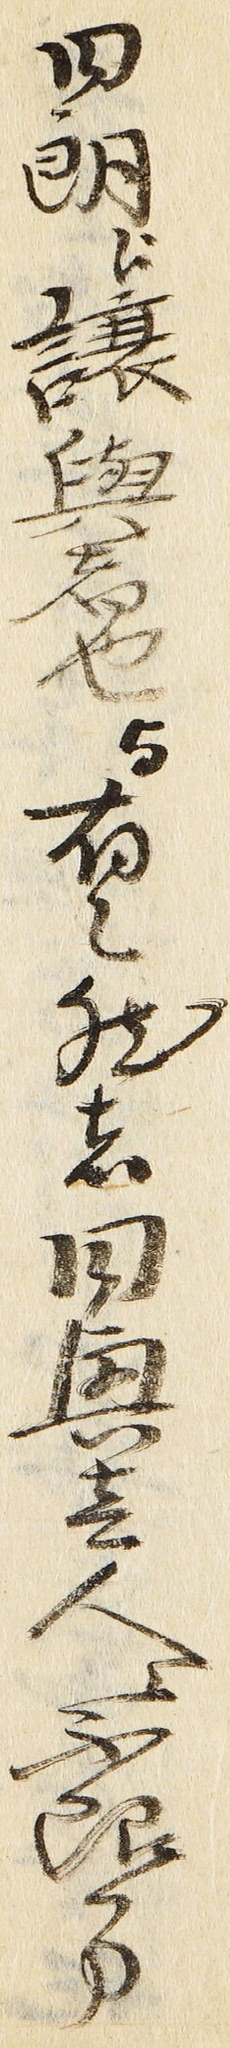日朗江譲与者也と有之然は日興壱人に不限事
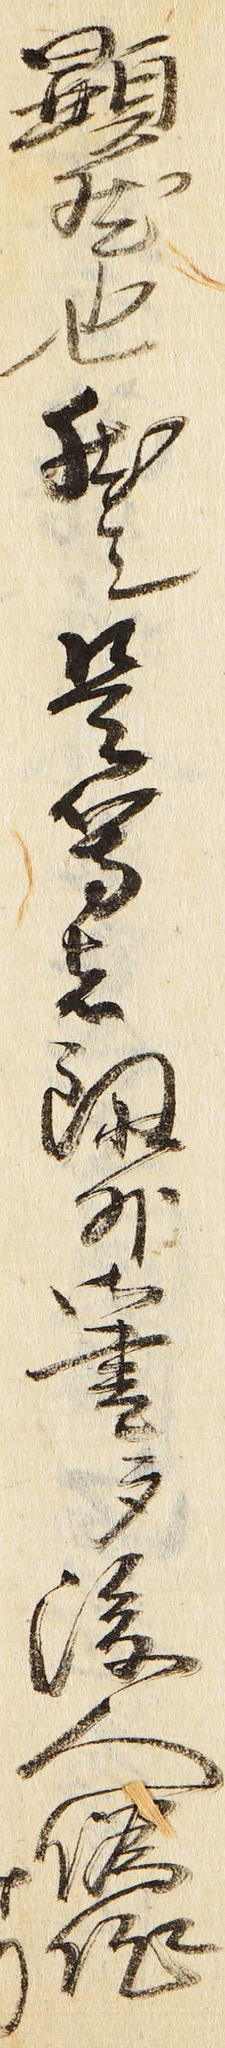顕然也然シ是等は録外御書多後人偽作なり
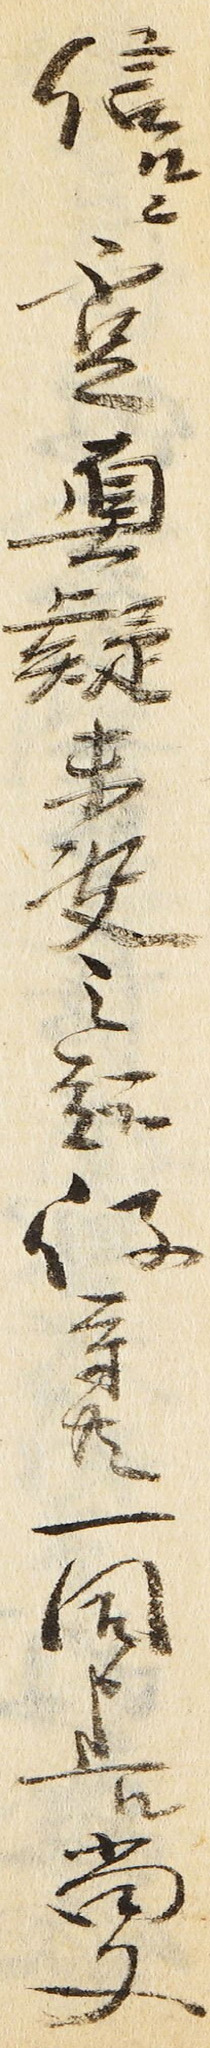信ルに不足真疑未決之趣役寺共一同申上ル尚又
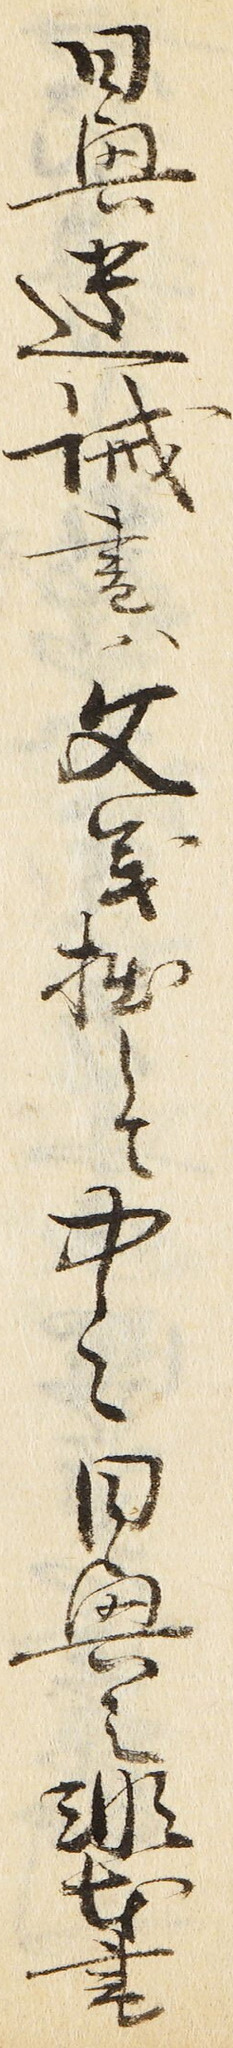日興遺誡書は文義拙して中々日興之非本書
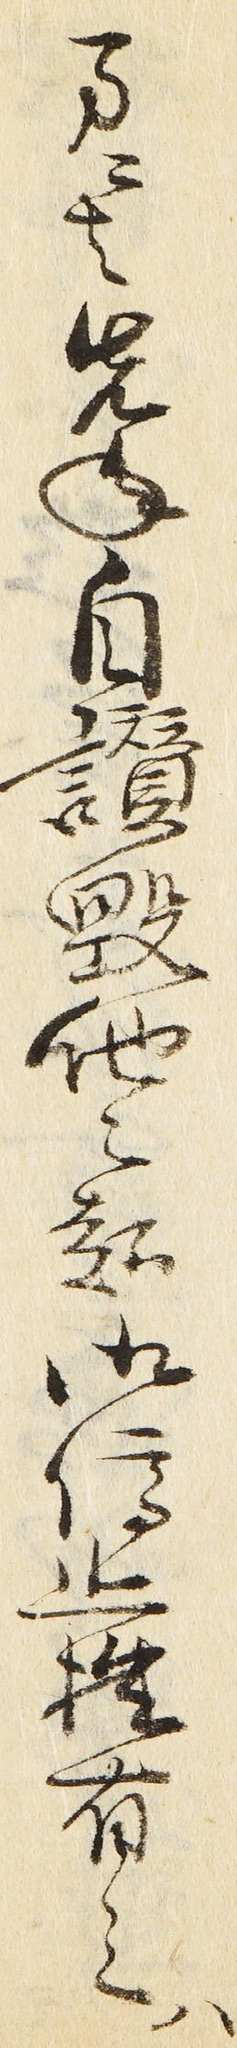事には先年自讃毀他之趣御停止掟有之は
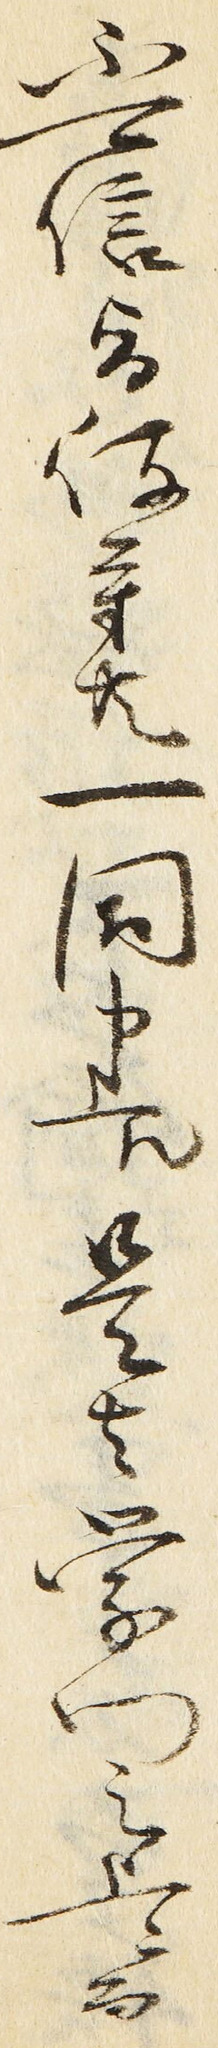不可信旨役寺共一同申上ル是は学問之上に而
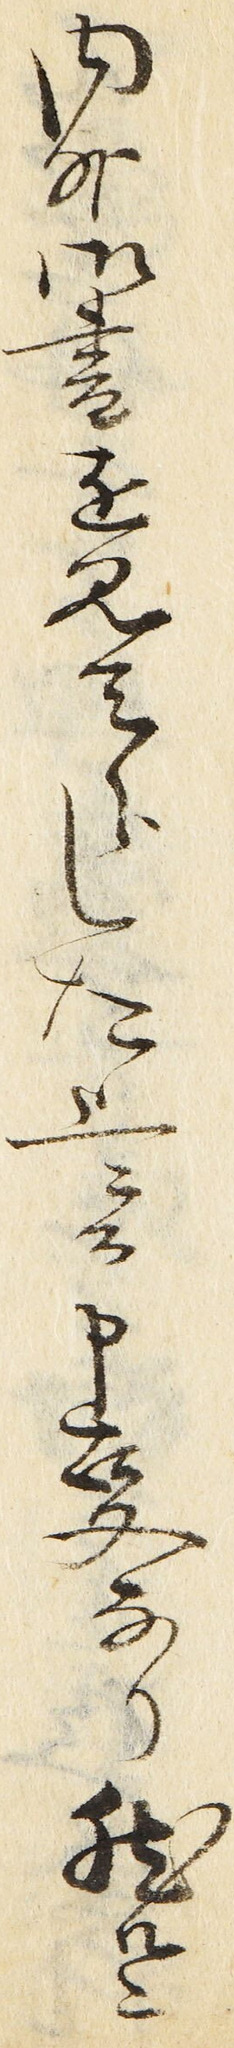内外御書を見て下した上に而申事なり然るに
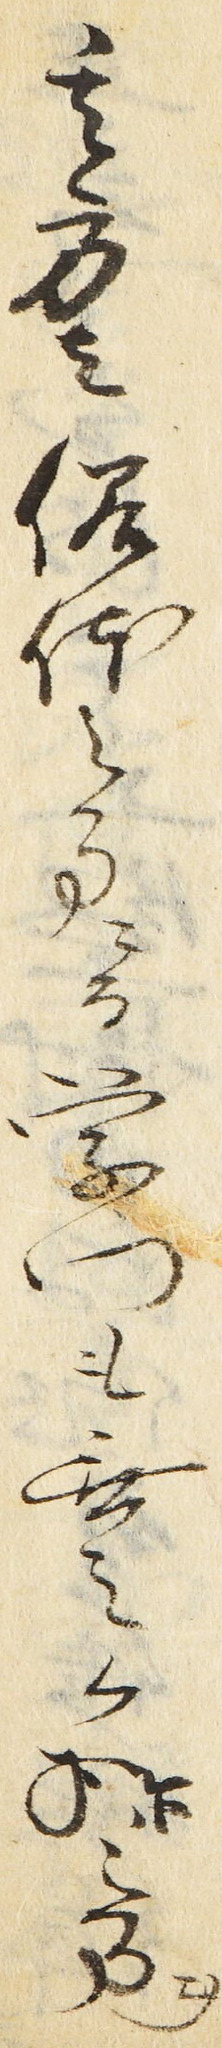其方は偽体之事に而学問も無之ケ様之事ヲ

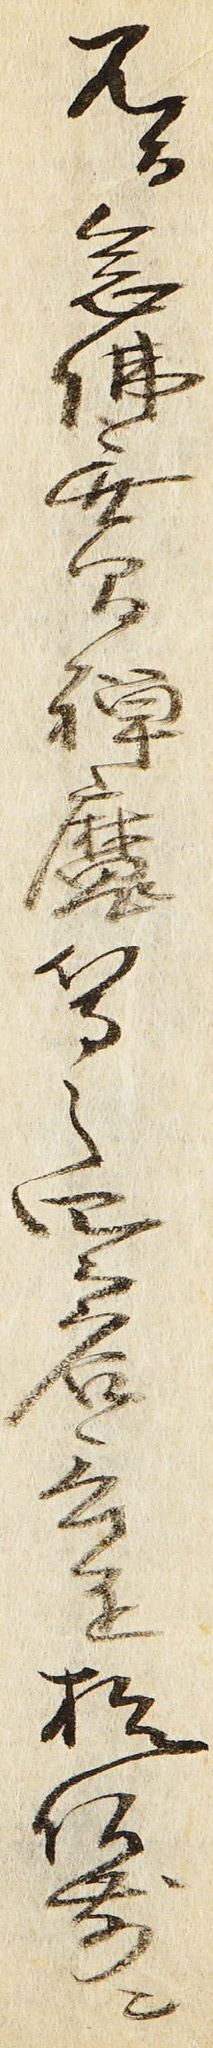見而念佛無間禅魔等之四ケ名言を於仏前に
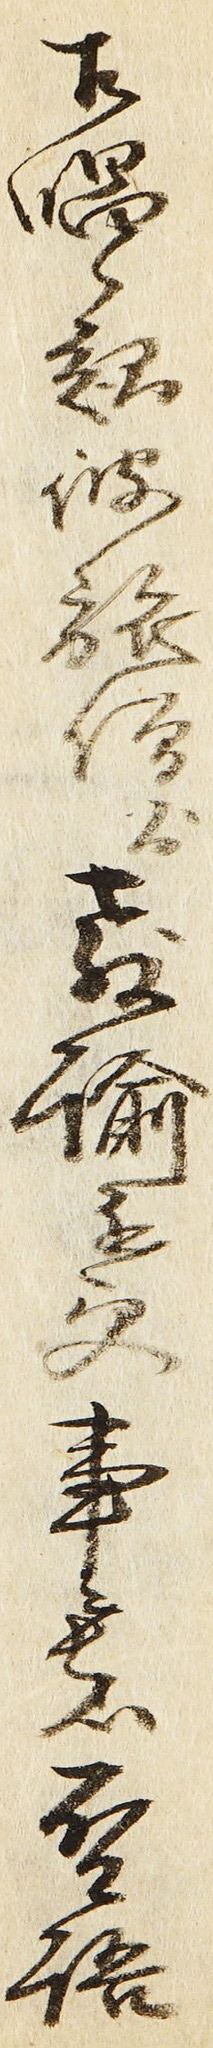相唱候趣彼旅僧ゟ教諭を受事には聖語
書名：異流一件日記
